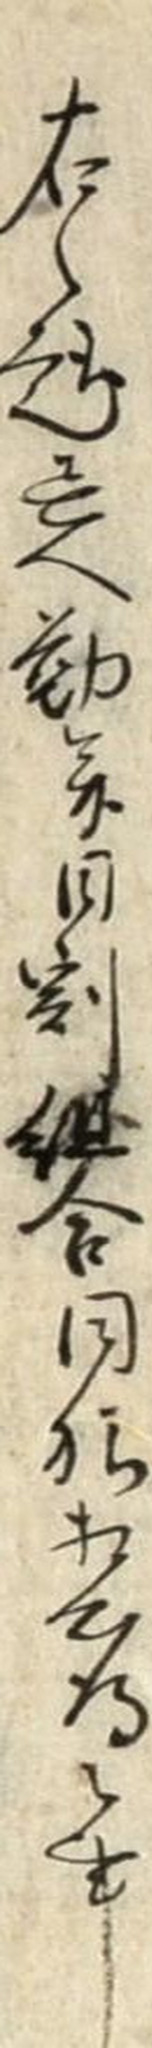右之趣壱人勤并目割組合同様相心得候事
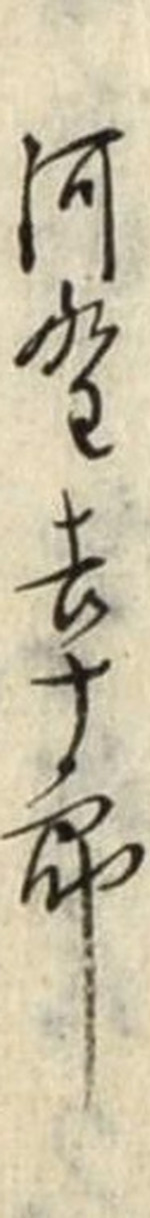阿野吉十郎
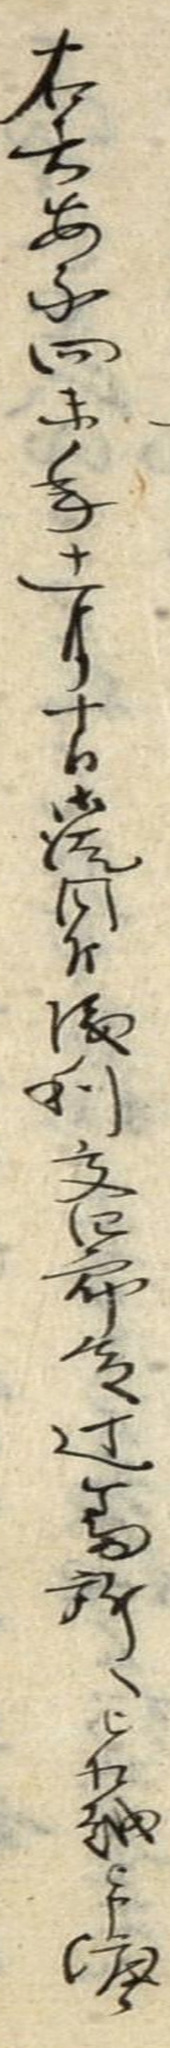右は安永四未年十一月十日御目付浅利文四郎殿辻番所へ被相越被申渡候

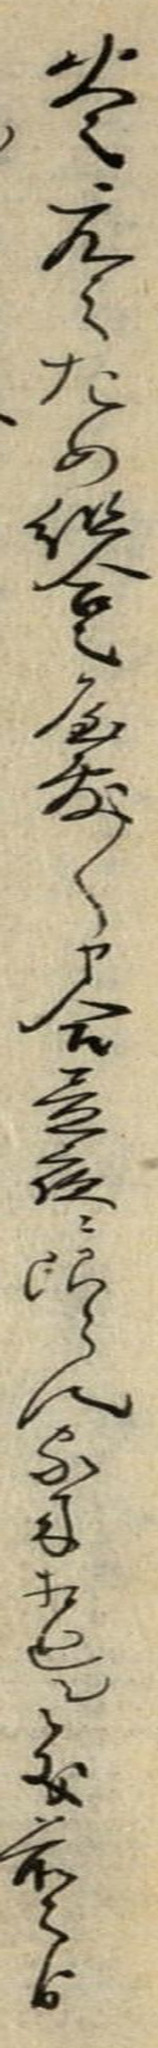火之元之ため組合之屋敷〳〵申合昼夜に限らす家来相廻し候義前々ゟ
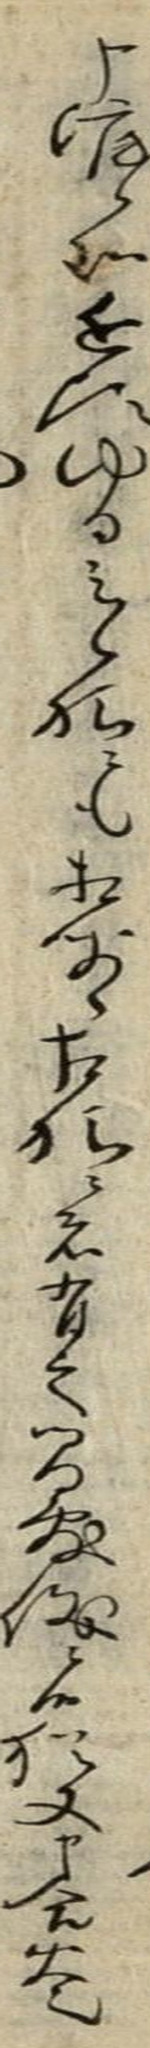申渡候処近頃ゆるみ候様にも相聞候左様には有之間敷儀に候猶又申合火之
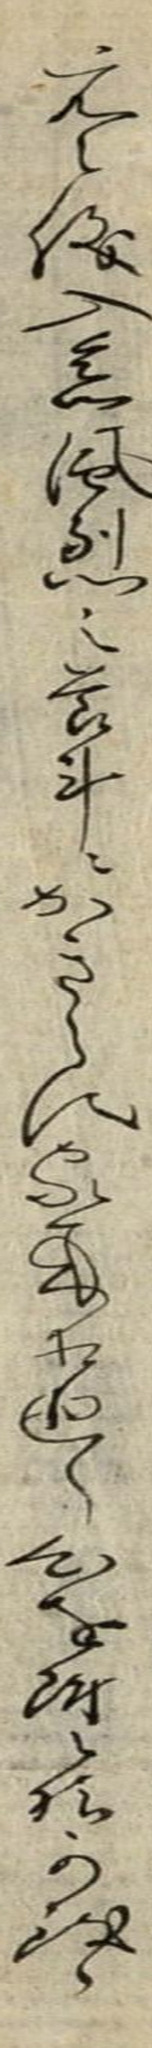元之儀入念風烈之節計にかきらす家来相廻し心を附候様可致候
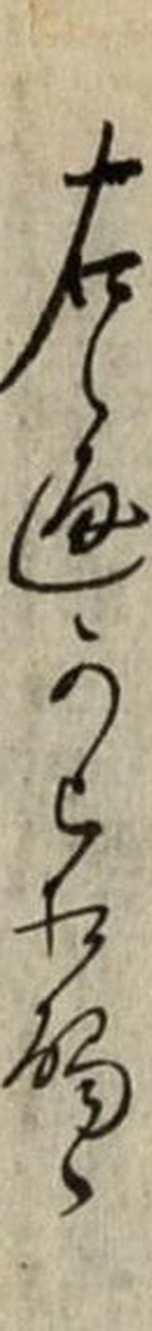右之通可被相触候
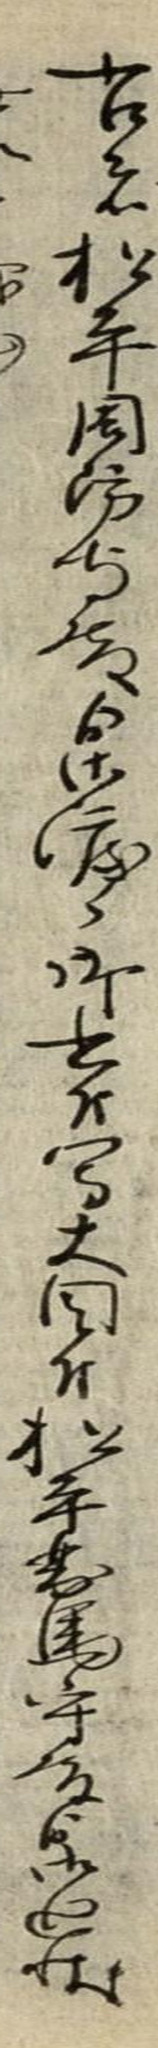右は松平周防守殿ゟ御渡候御書付写大目付松平対馬守殿ゟ御廻状
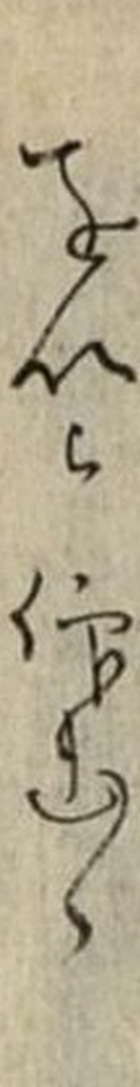を以被仰出候
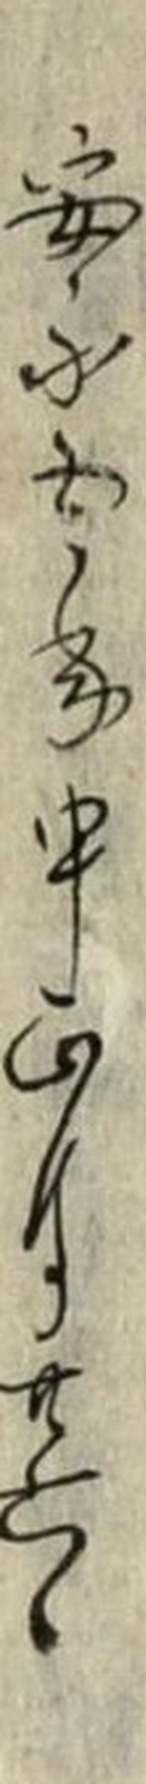安永五年申正月廿六日
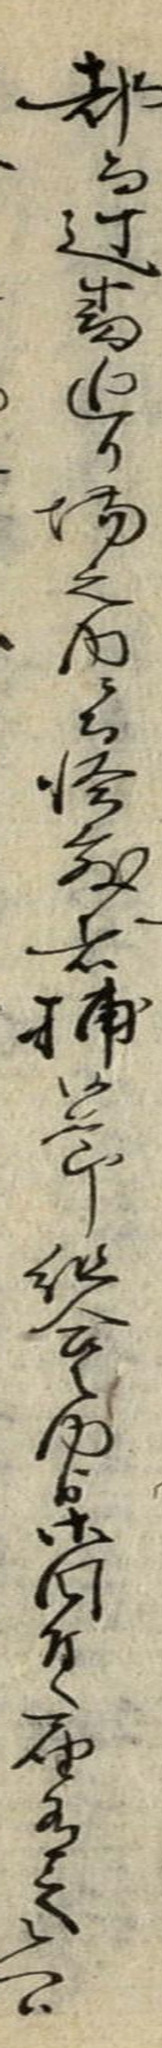都て辻番廻り場之内にて怪敷者捕候節組合之内ゟ御目付へ届有之候へは
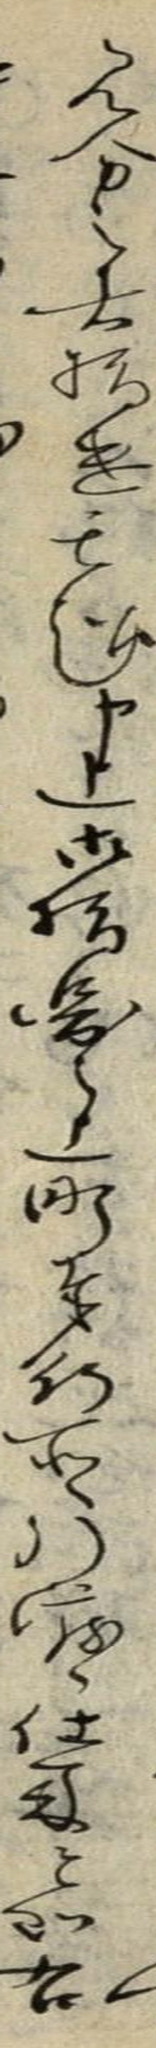見聞之者指遣其趣申上御指図之上町奉行所へ引渡候仕来に候処右
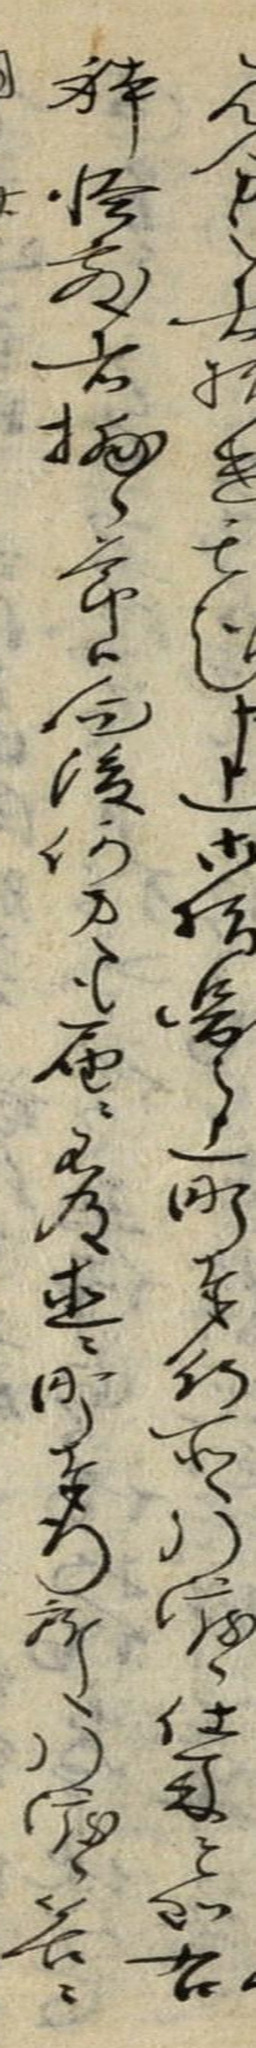体怪敷者捕候節は向後何方へも届に不及直に町奉行所へ引渡候筈に
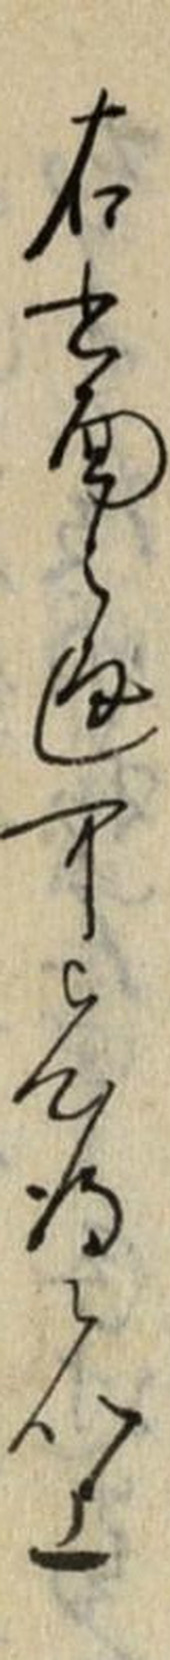右書面之通可被心得候以上
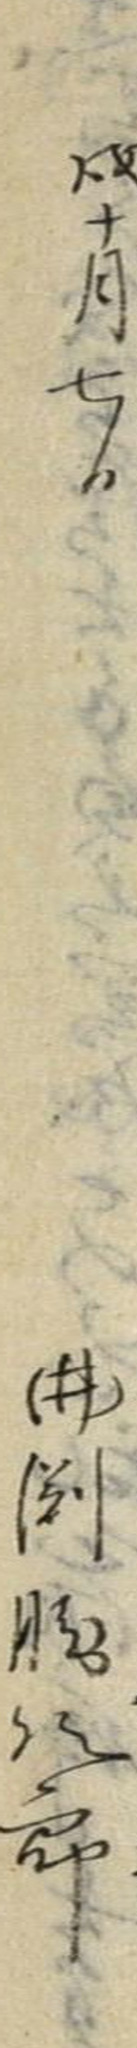戌十月七日曲渕勝次郎
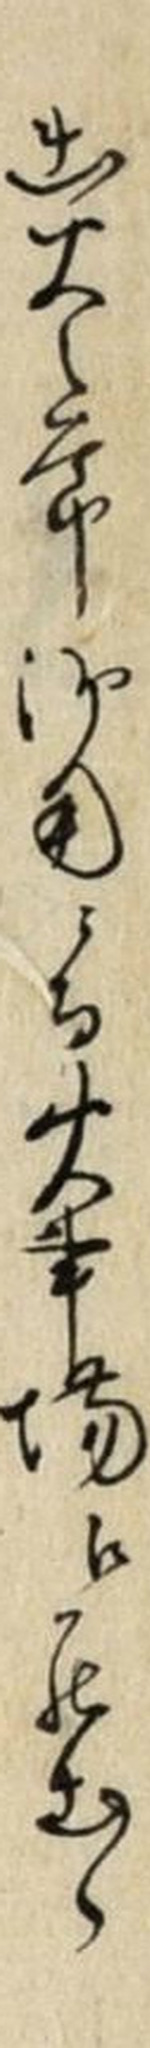出火之節御用にて火事場江罷出候
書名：三都并道中之部
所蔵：福井県文書館 Fukui Prefectural Archives
